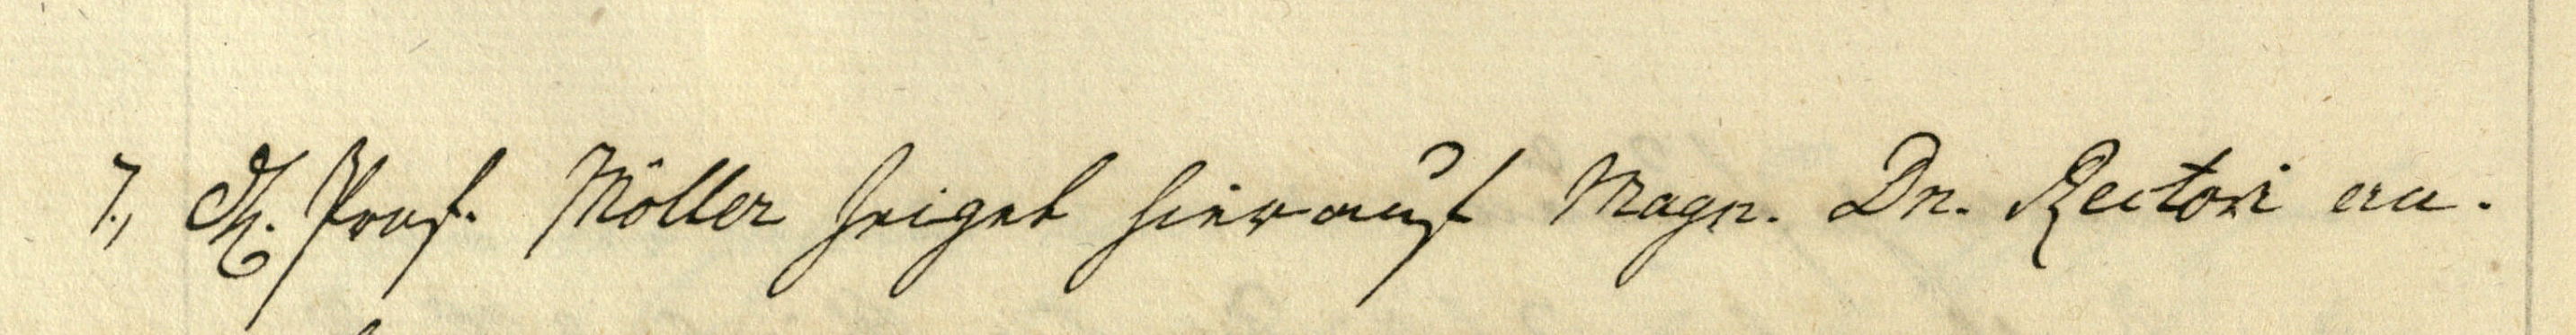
7. d.h. Prof. Möller zeiget hierauf Magn. Dn. Rectori an-
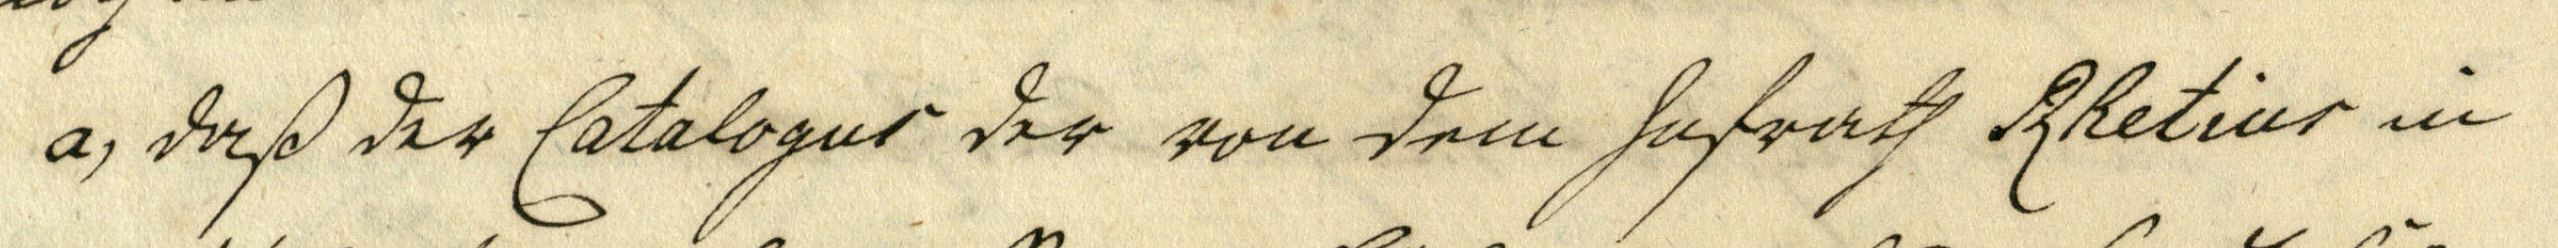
a) daß der Catalogus der von dem hofrath Rhetius in
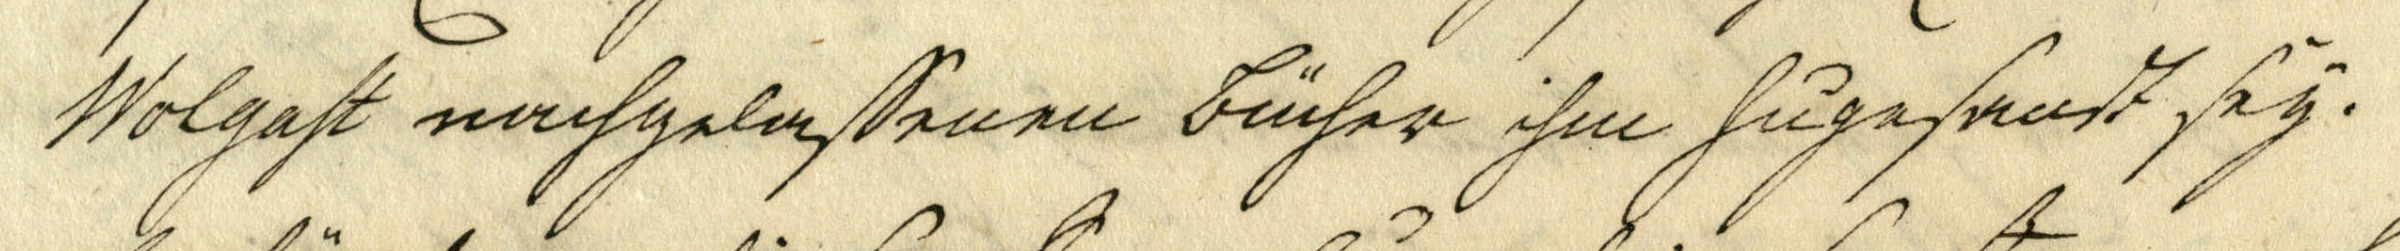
Wolgast nachgelassenen Bücher ihm zugesandt sey.
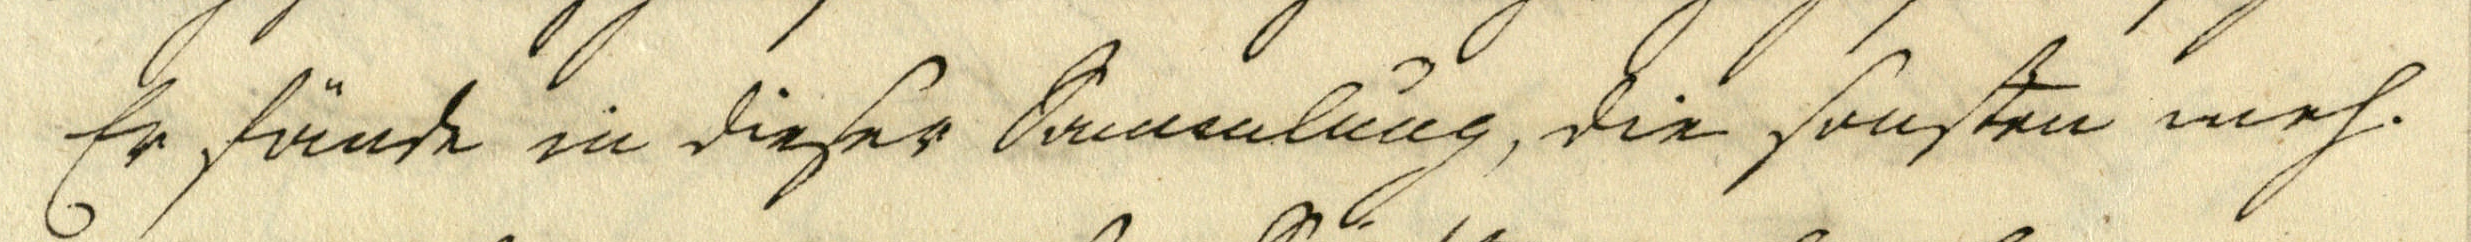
Er fände in dieser Sammlung, die sonsten meh-
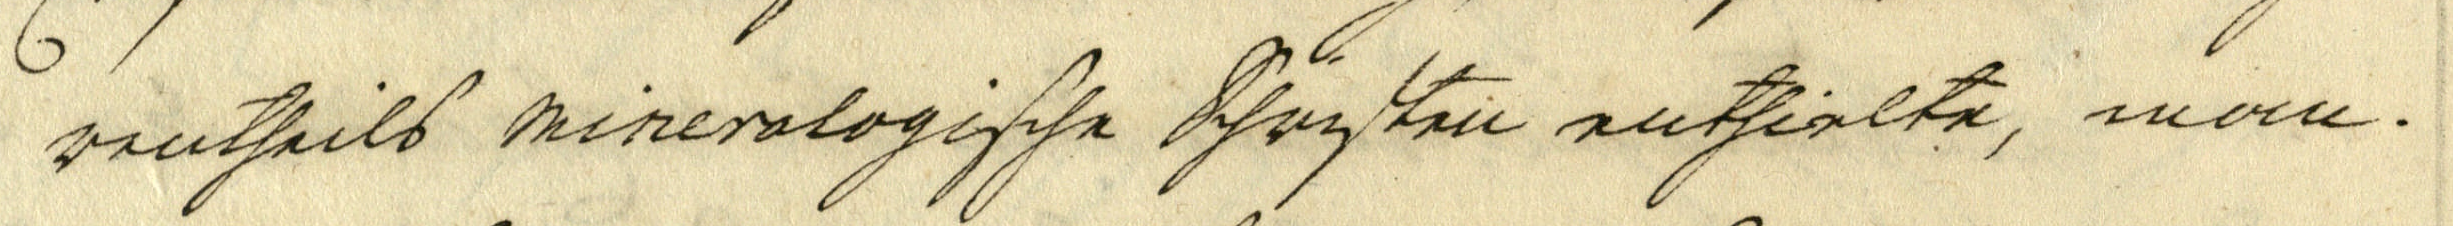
rentheils mineralogische Schriften enthielte, man-
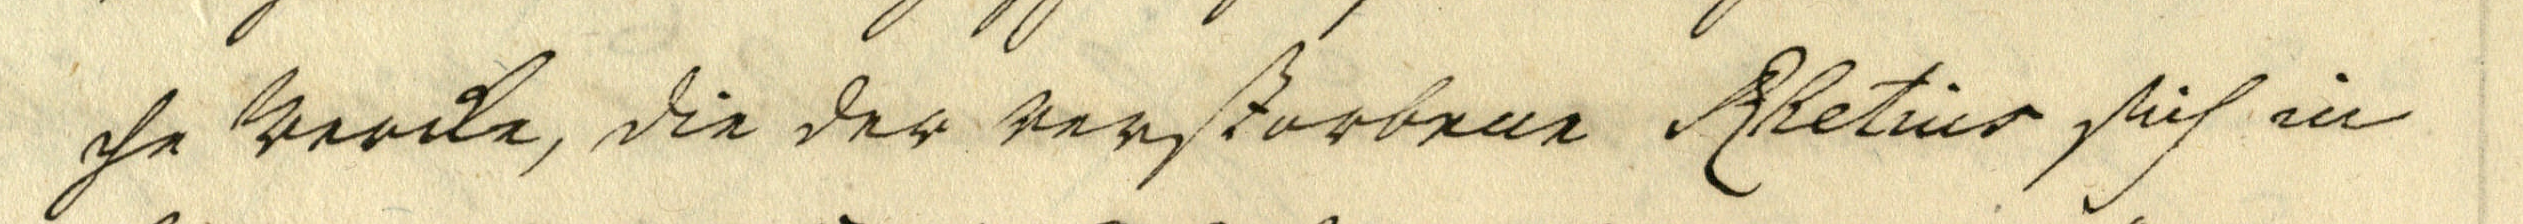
che Werke, die der verstorbene Rhetius sich in
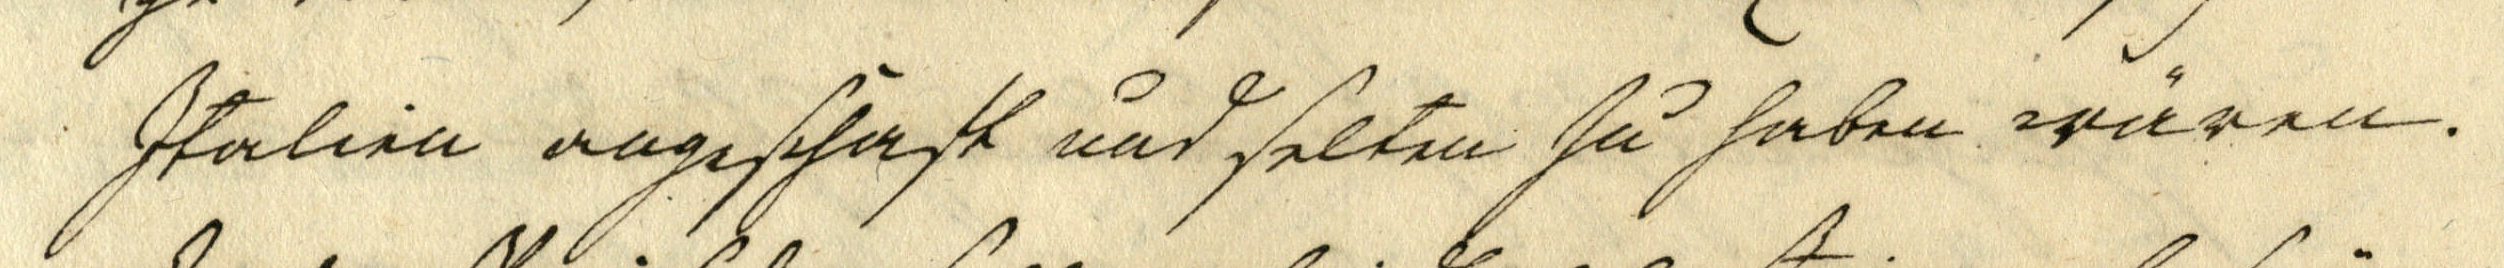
Italien angeschaft und selten zu haben wären.
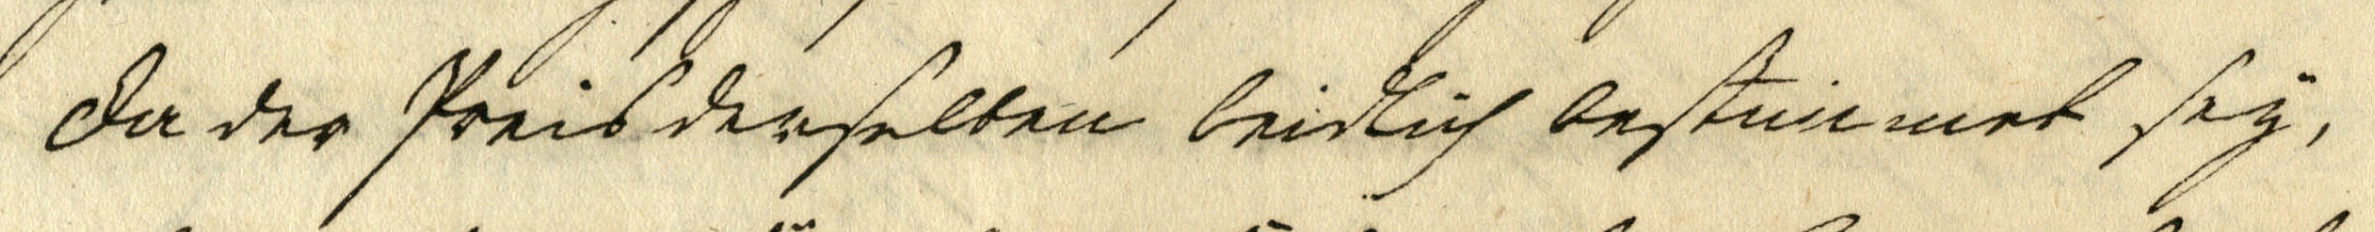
Da der Preis derselben leidlich bestimmet sey,
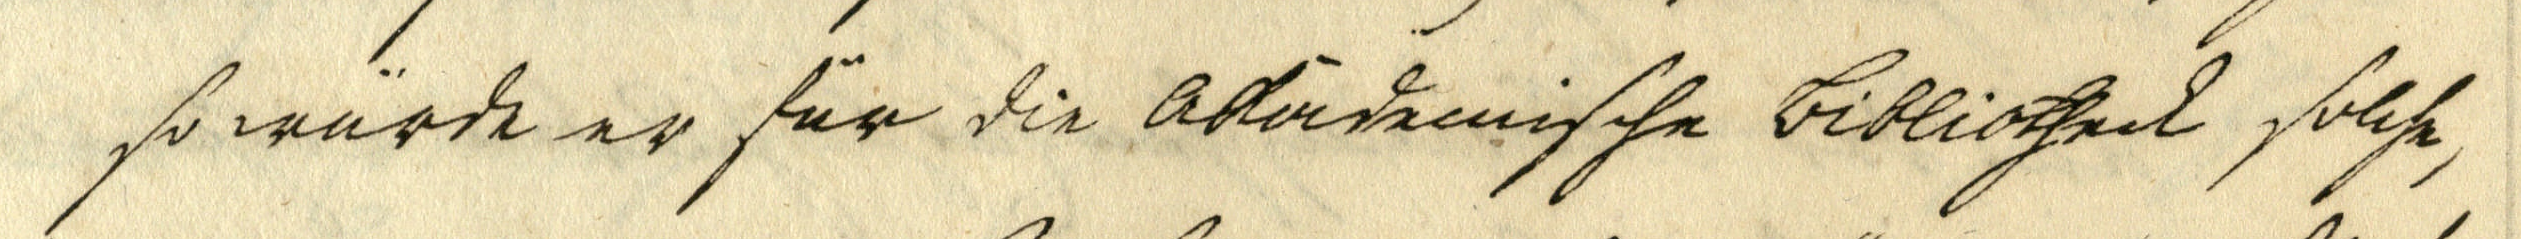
so würde er für die Akademische Bibliothek solche,
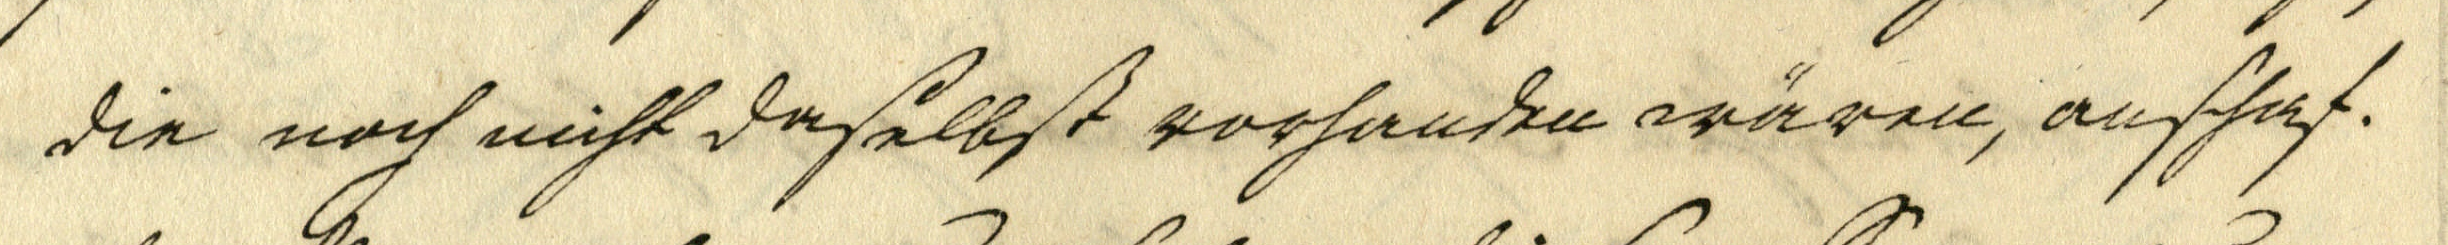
die noch nicht daselbst vorhanden wären, anschaf-
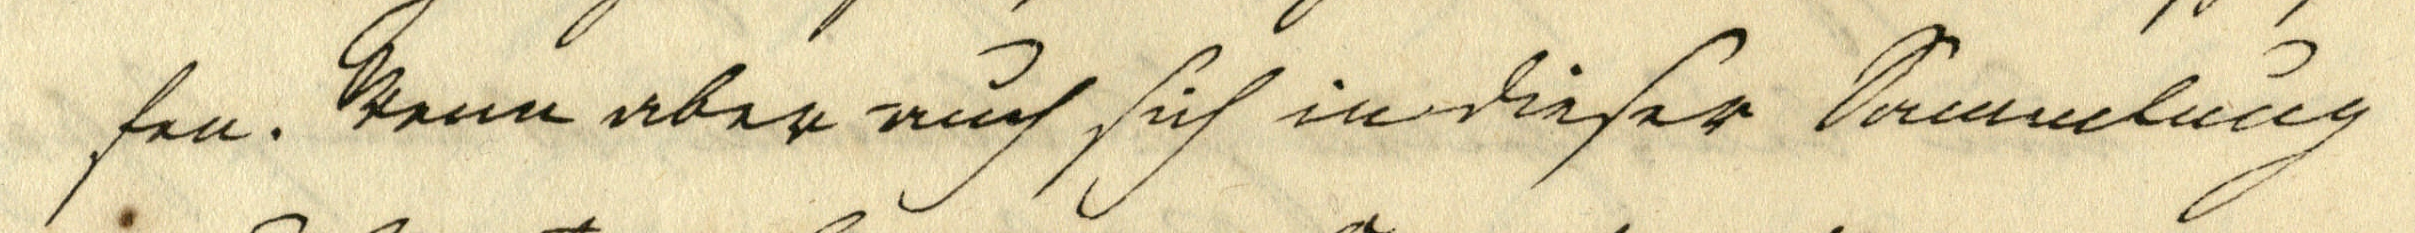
fen. Wenn aber auch sich in dieser Sammlung
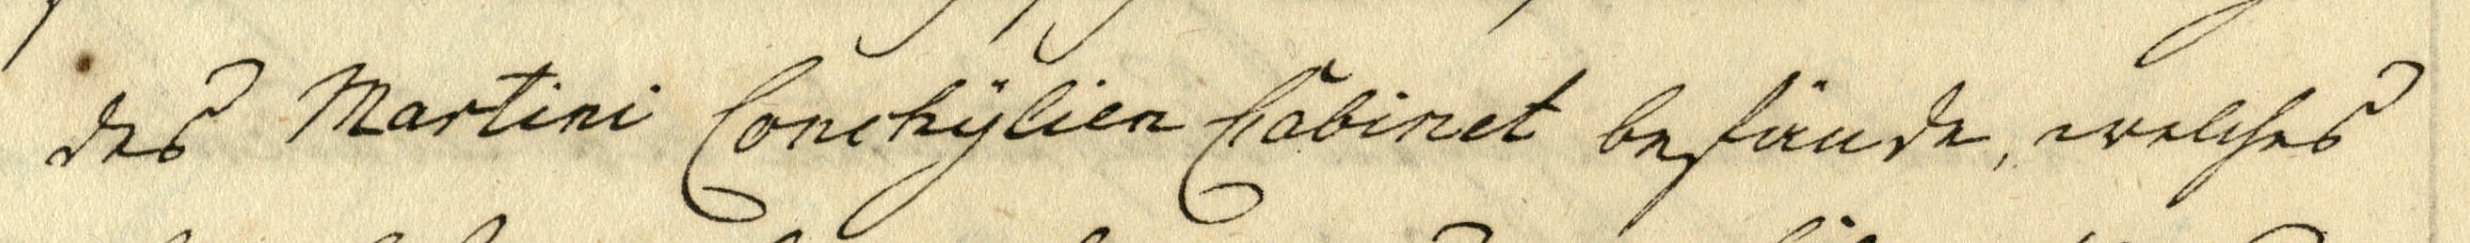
des Martini Conchylien Cabinet befände, welches
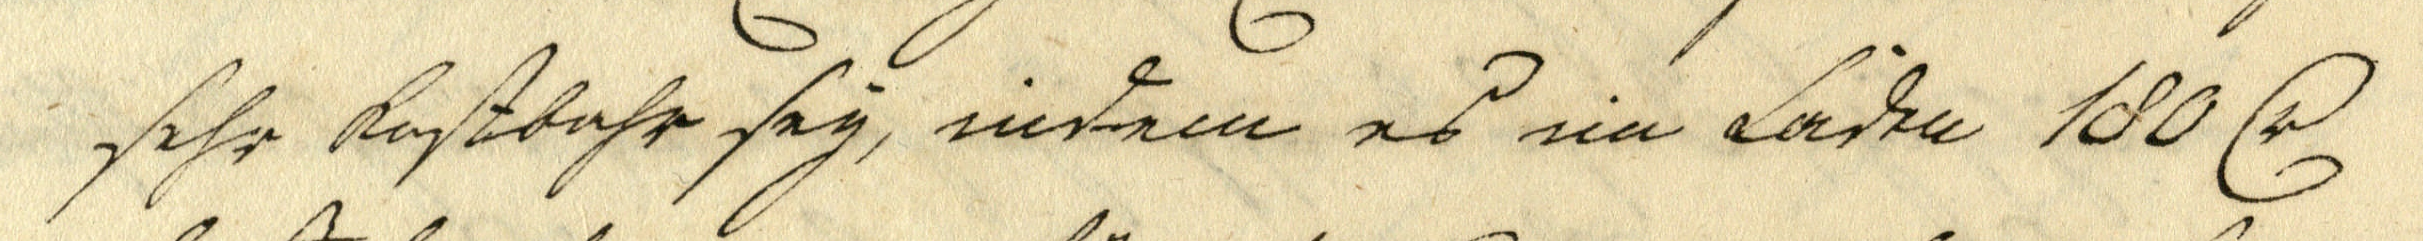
sehr kostbahr sey, indem es im Laden 180 rtl.
